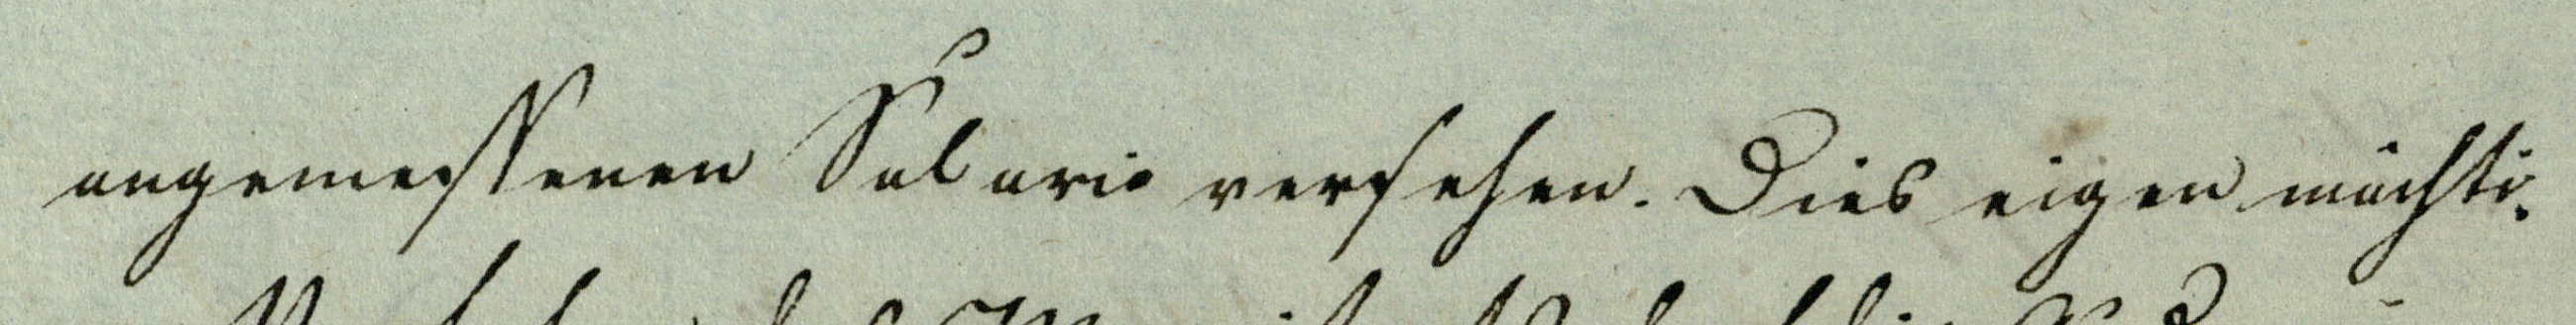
angemessenen Salario versehen. Dies eigenmächti¬
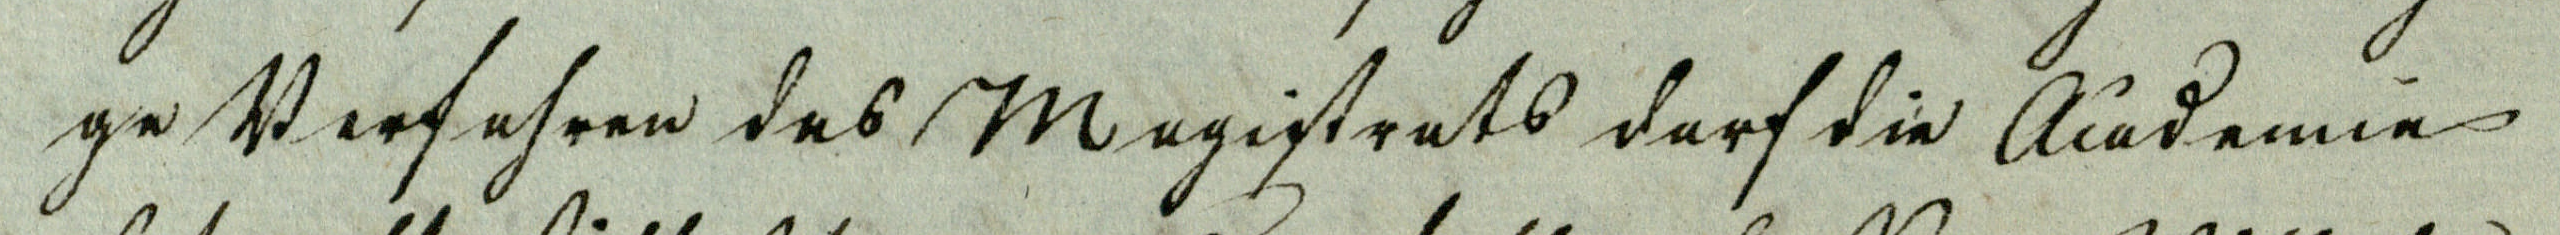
ge Verfahren des Magistrats darf die Academie
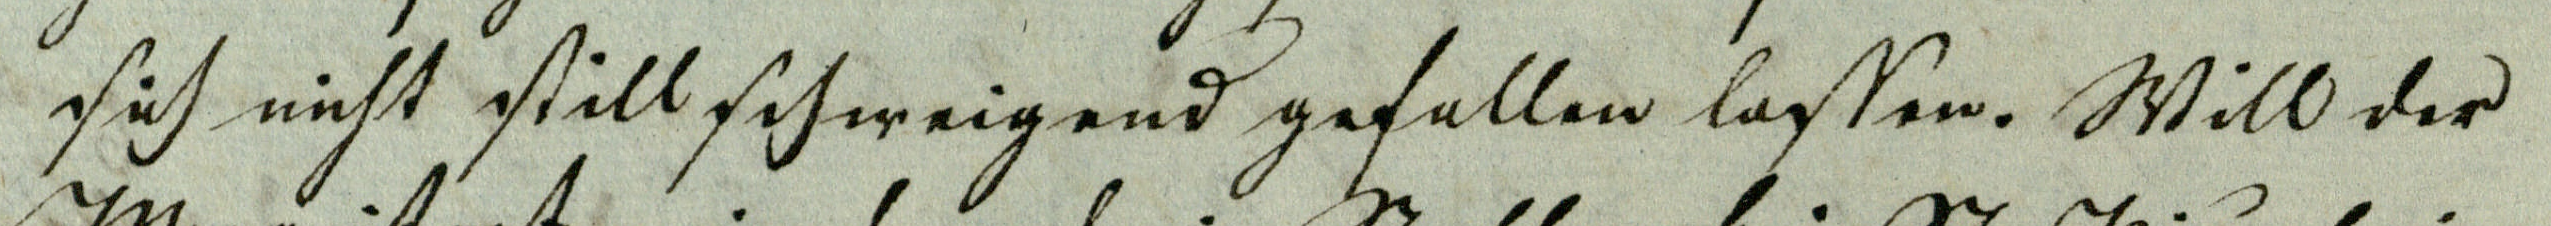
sich nicht still schweigend gefallen lassen. Will der
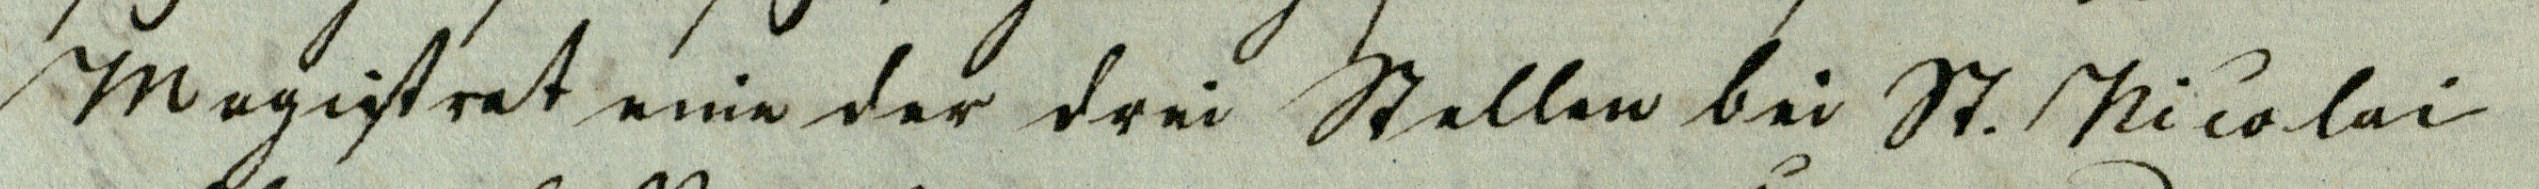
Magistrat eine der drei Stellen bei St. Nicolai
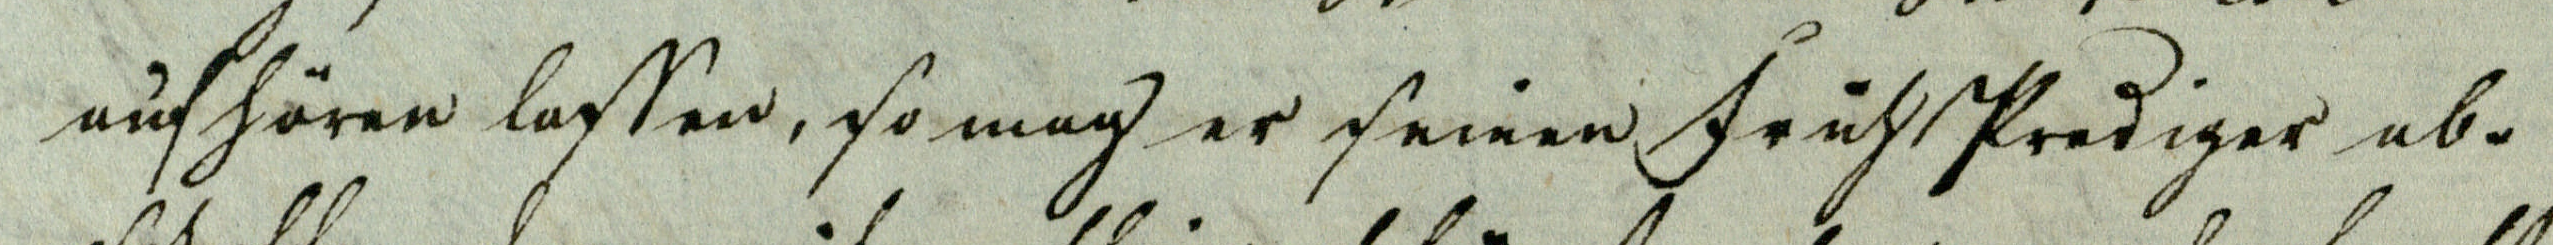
aufhören lassen, so mag er seinen Früh Prediger ab¬
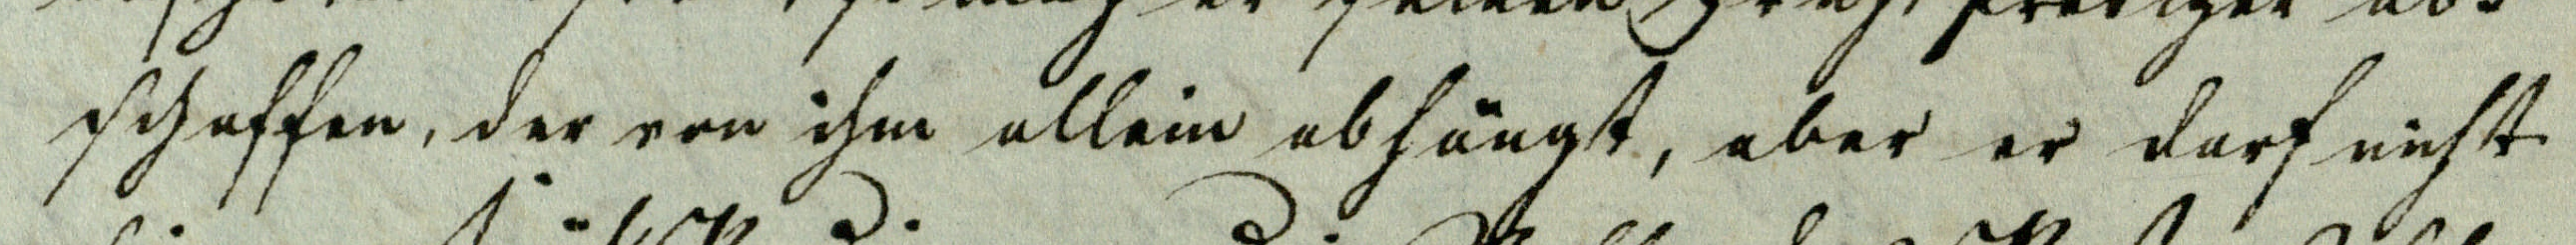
schaffen, der von ihm allein abhängt, aber er darf nicht
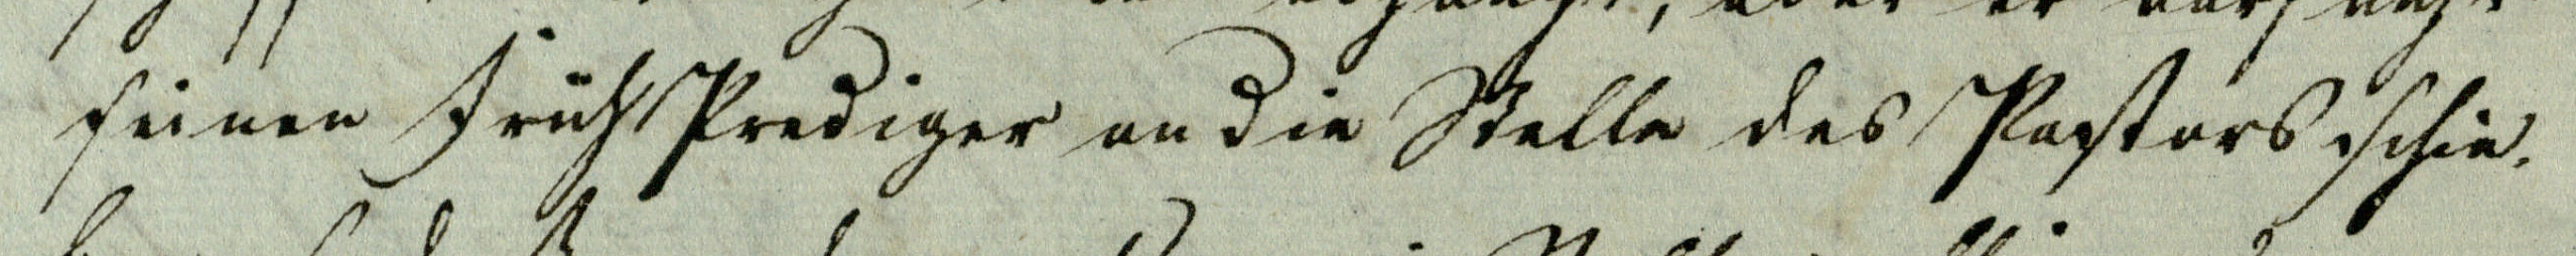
seinen Früh Prediger an die Stelle des Pastors schie¬
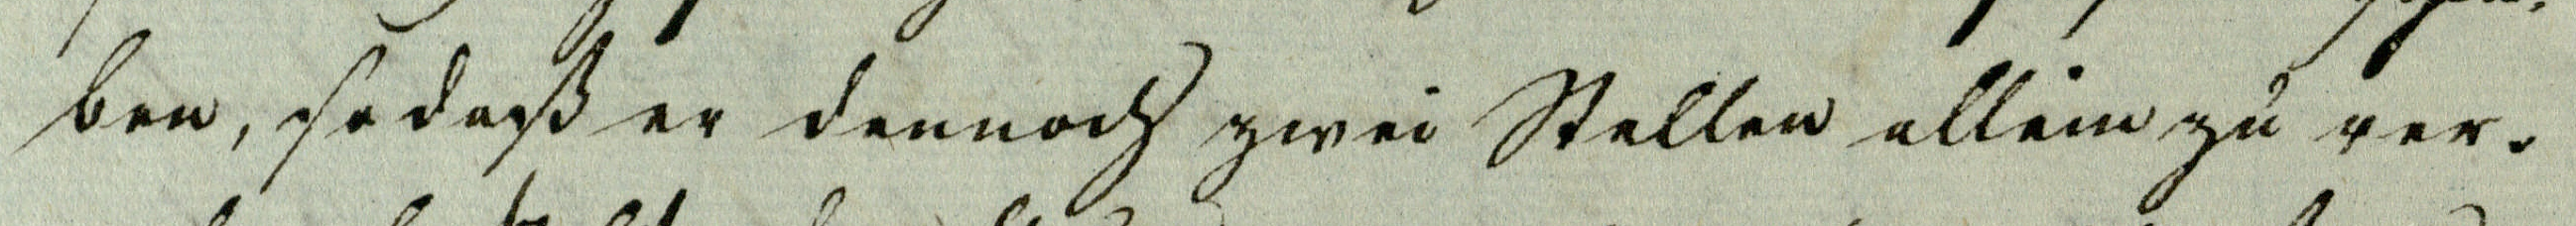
ben, so daß er dennoch zwei Stellen allein zu ver¬
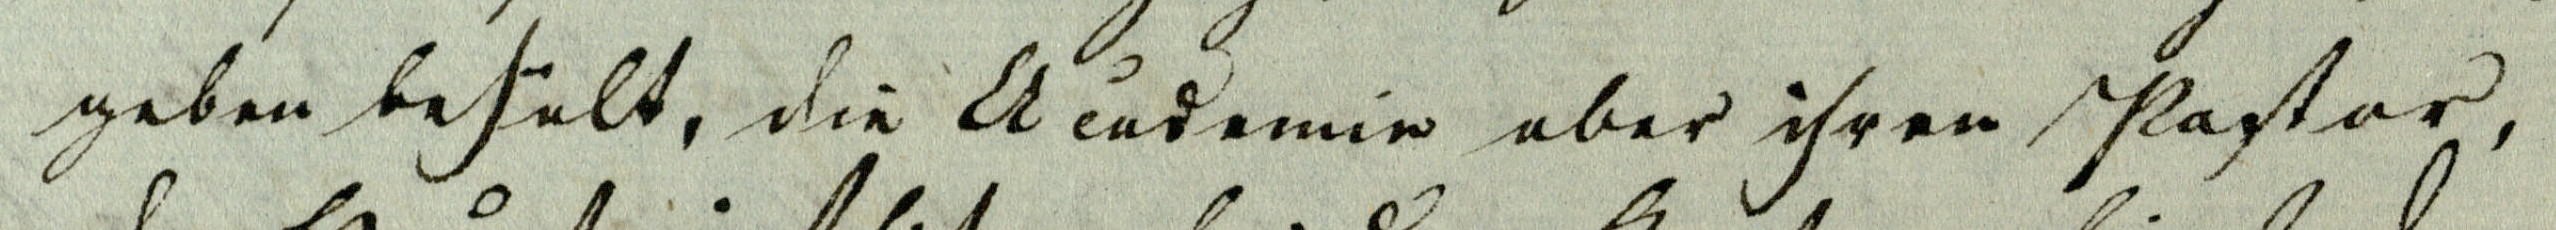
geben behält, die Academie aber ihren Pastor,
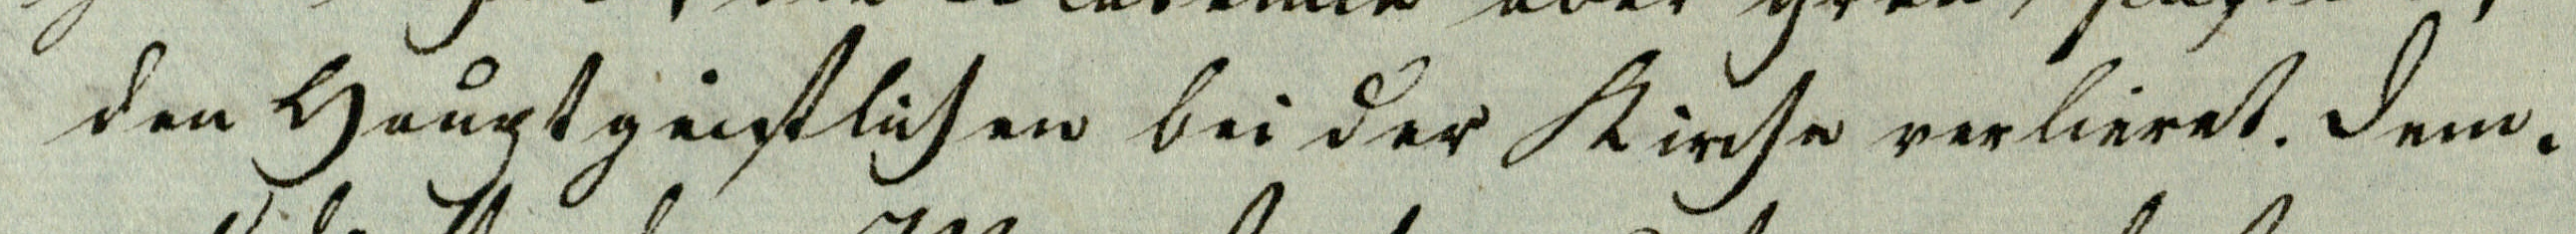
den Hauptgeistlichen bei der Kirche verlieret. Dem¬
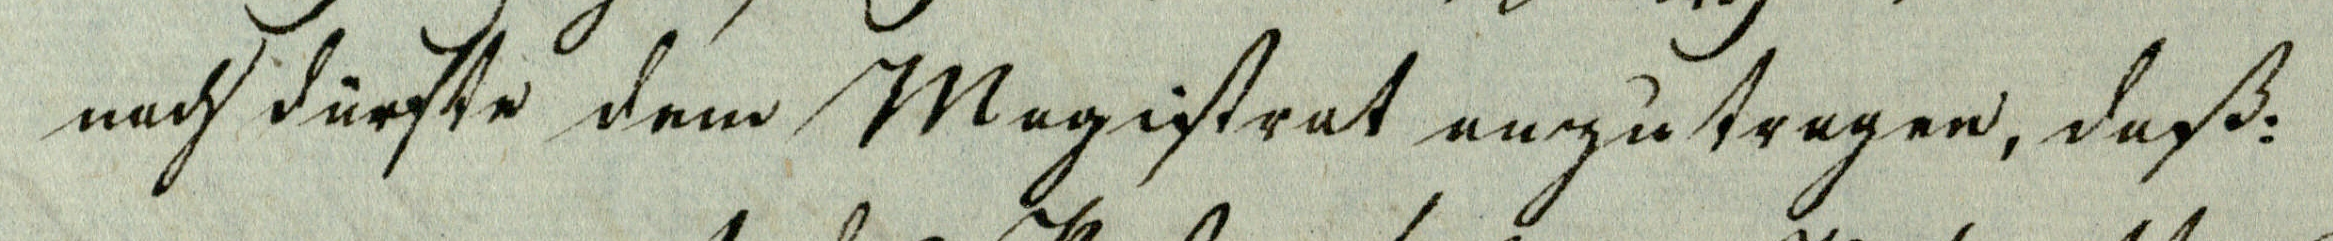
nach dürfte dem Magistrat anzutragen, daß:
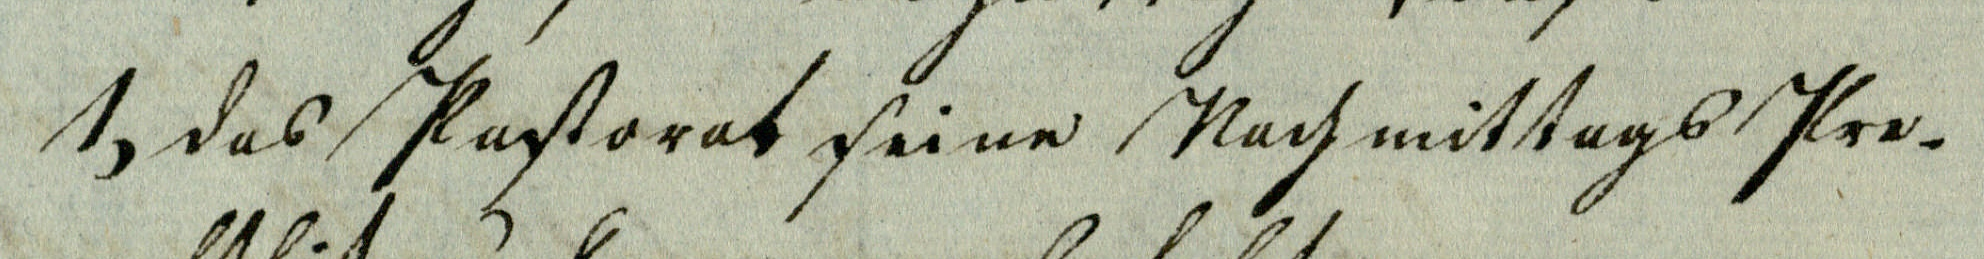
1. das Pastorat seine Nachmittags Pre¬
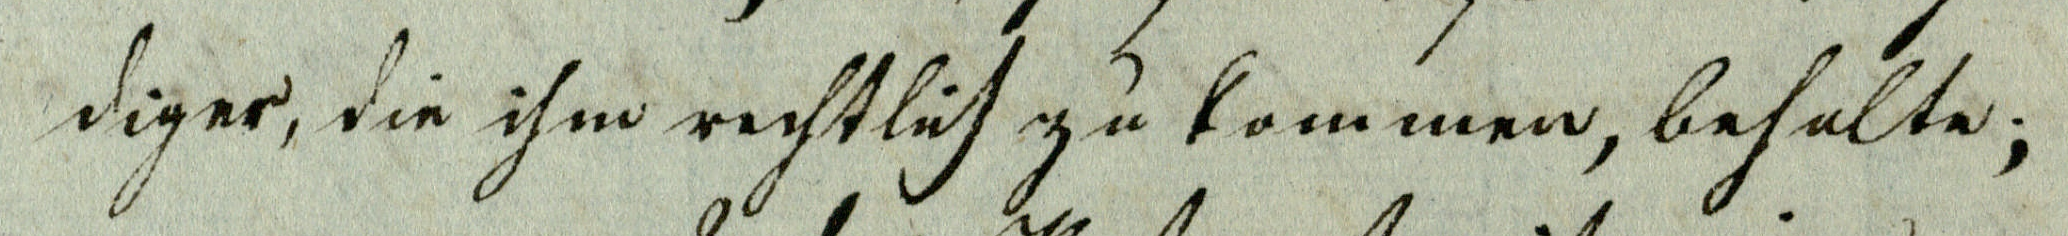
diger, die ihm rechtlich zu kommen, behalte;
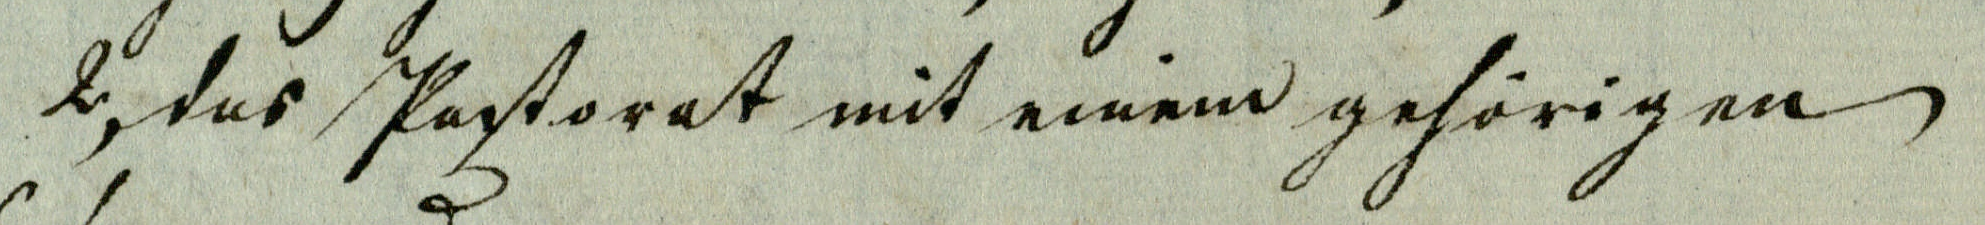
2. das Pastorat mit einem gehörigen
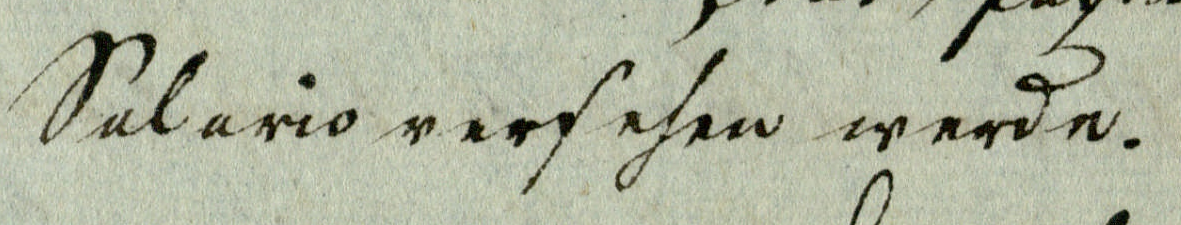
Salario versehen werde.
